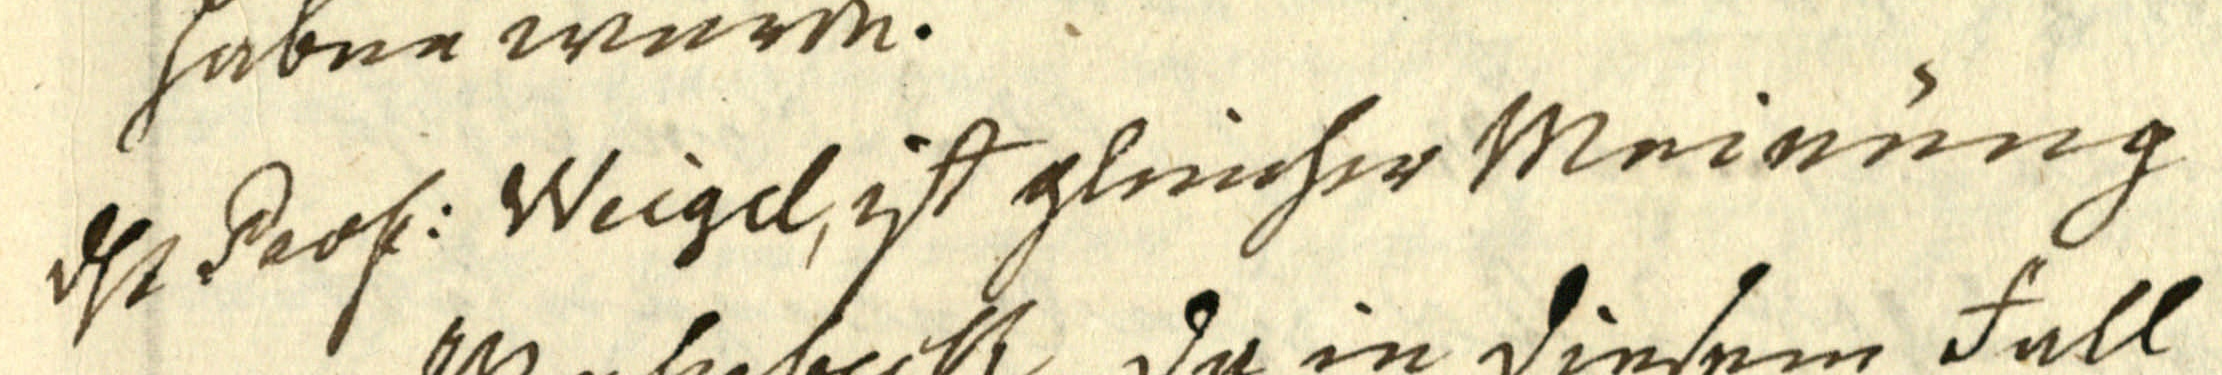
dh. Prof. Weigel ist gleicher Meinung.
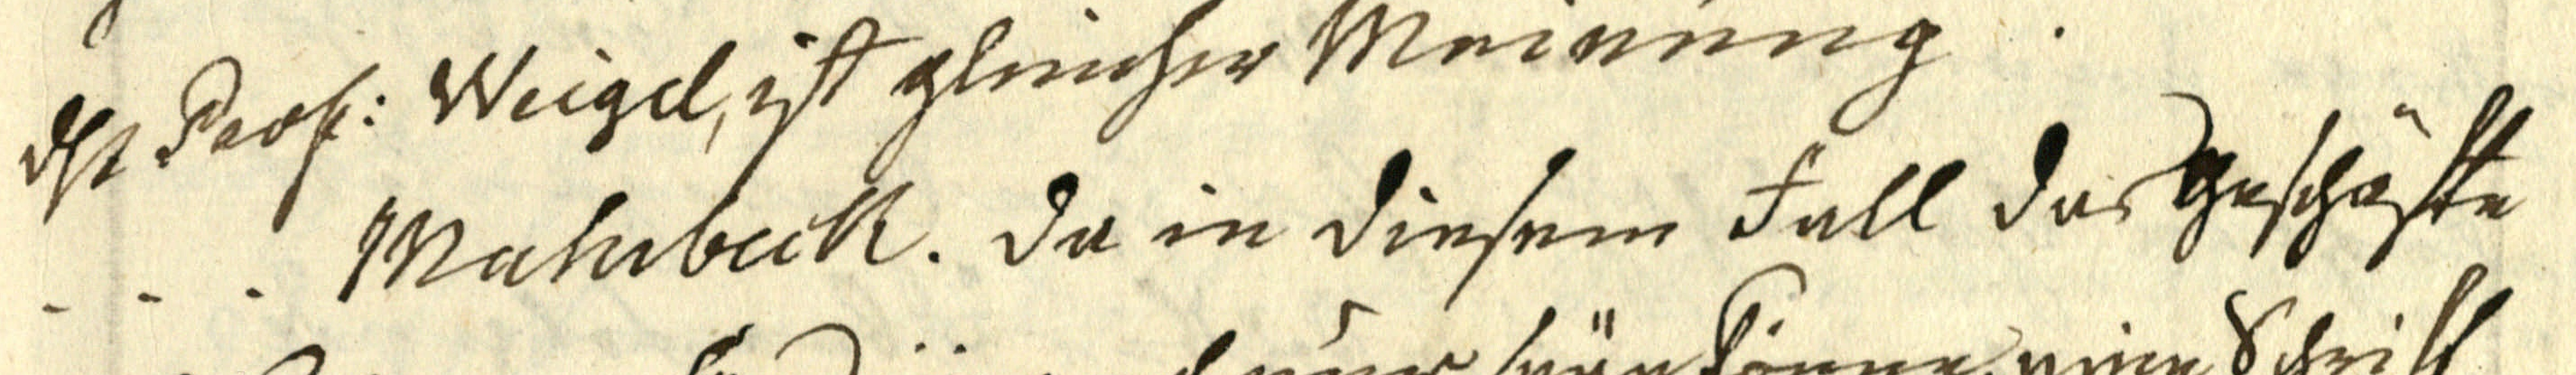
Muhrbeck. Da in diesem Fall das Geschäfte
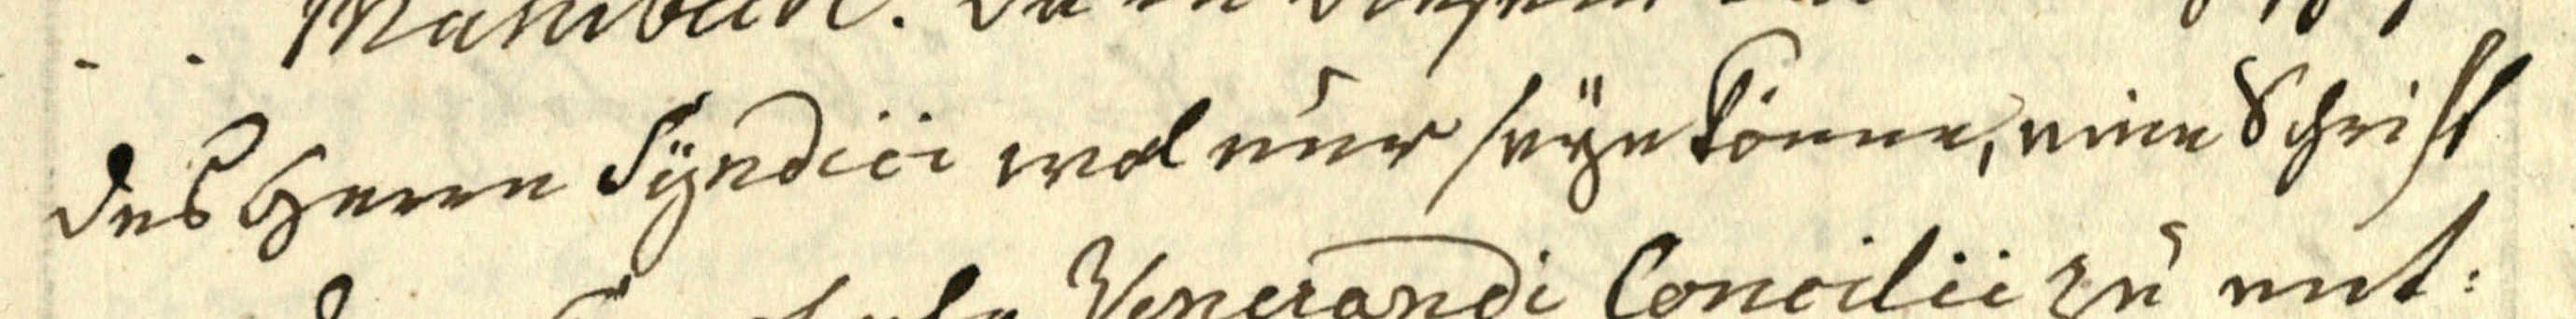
des Herrn Sÿndici wol nur seÿn könne, eine Schrift
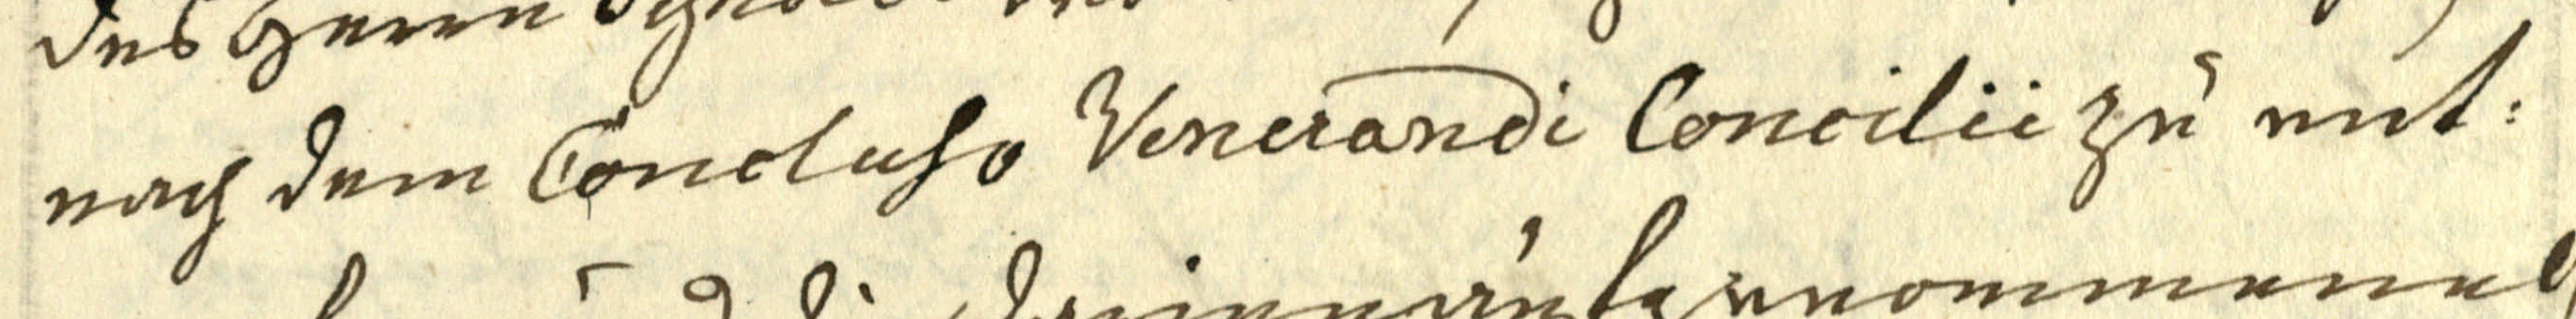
nach dem Concluso Venerandi Concilii zu ent¬
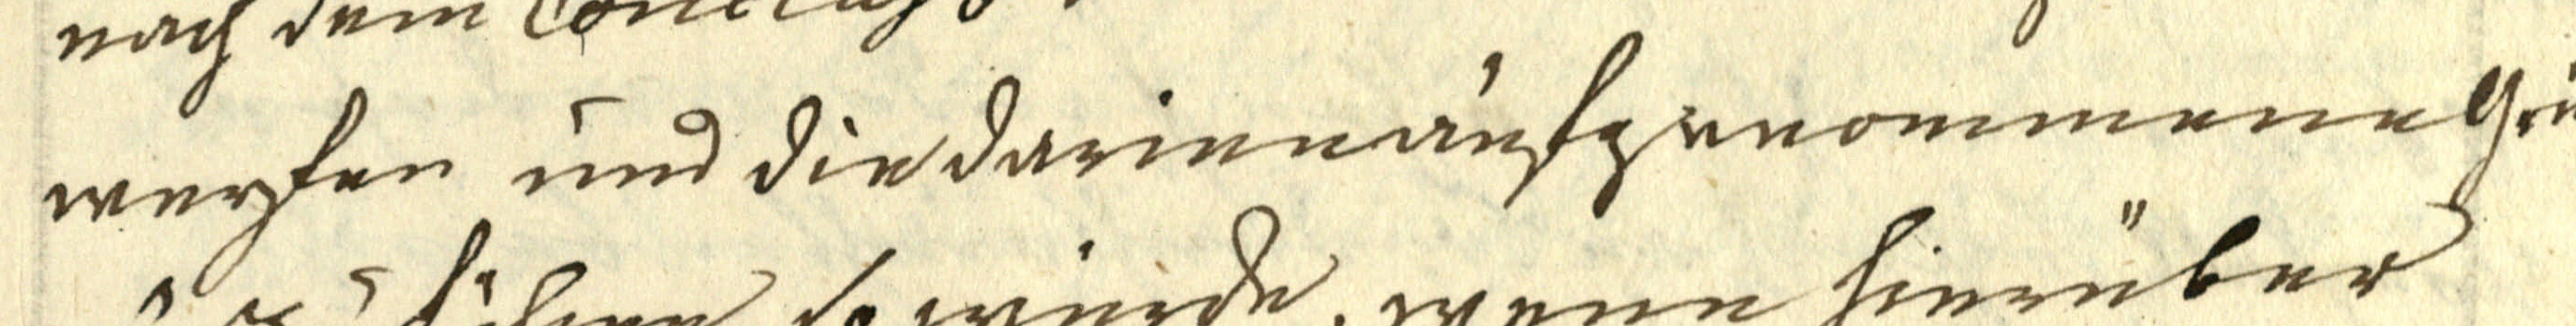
werfen und die darinn aufgenommene Gründe
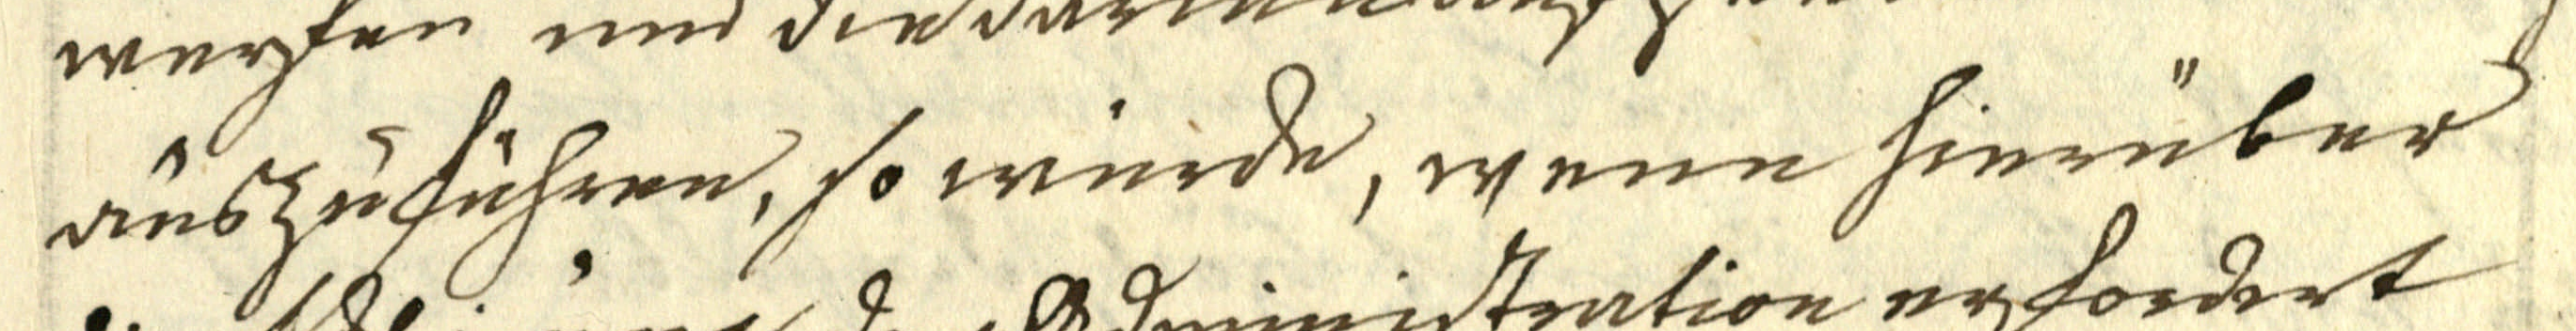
auszuführen, so würde, wenn hierüber
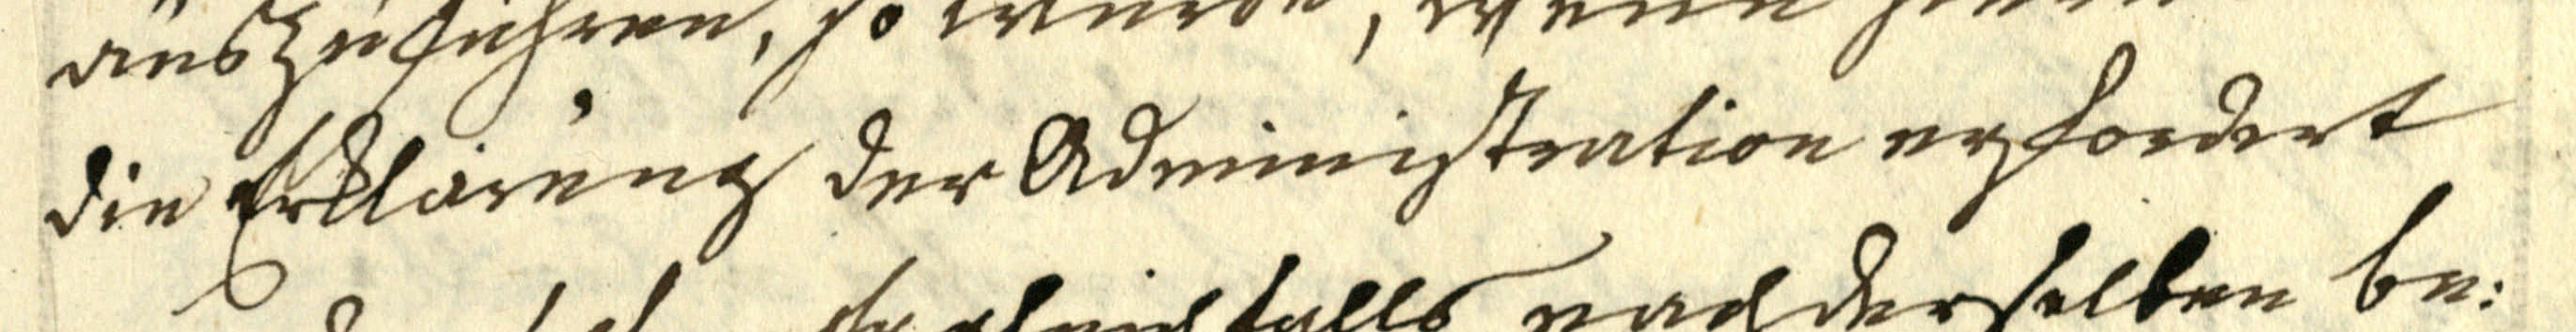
die Erklärung der Administration erfordert
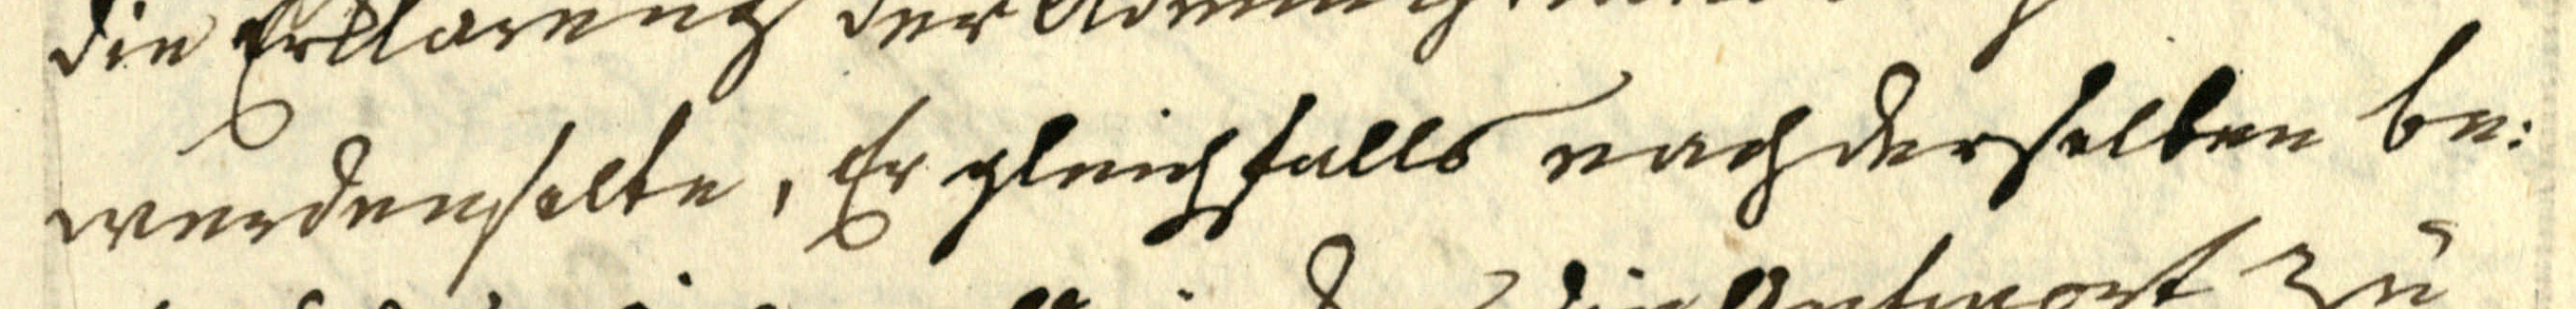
werden solte, Er gleichfalls nach derselben Be¬
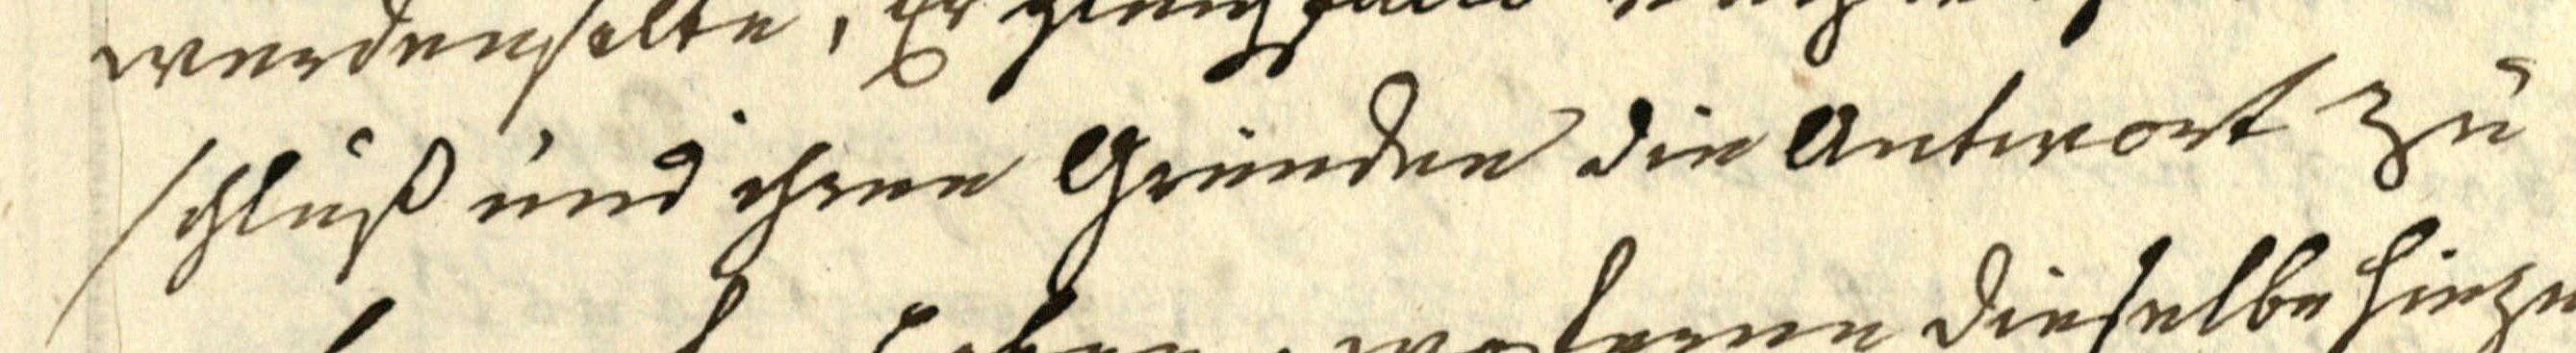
schluß und ihren Gründen die Antwort zu
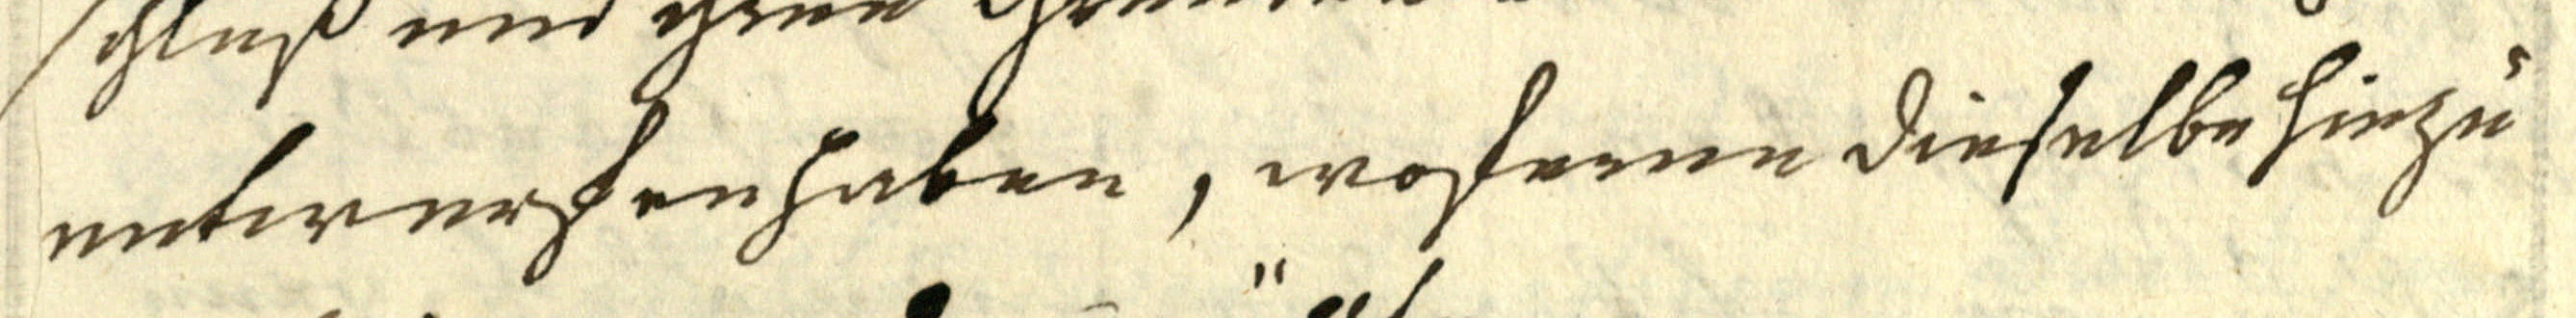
entwerfen haben, woferne dieselbe hiezu
